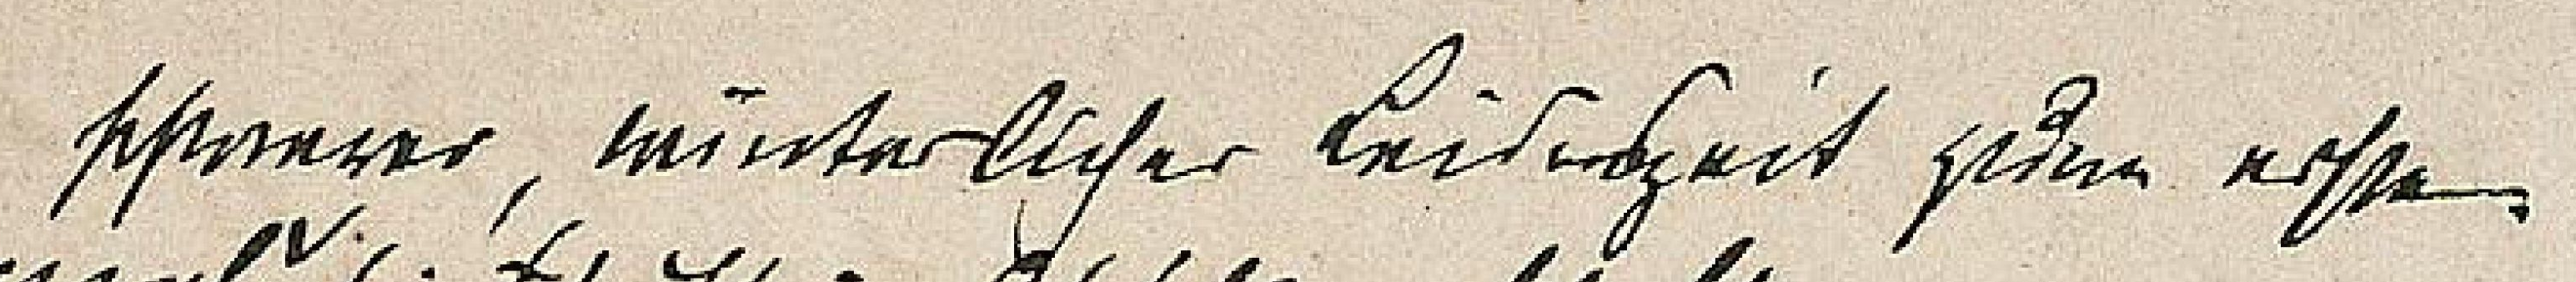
schwerer, winterlicher Leidenszeit zum ersten
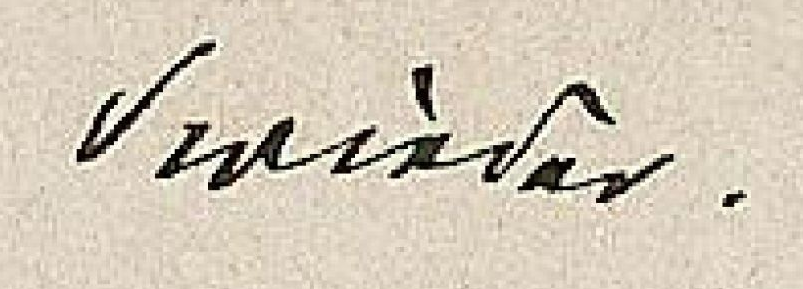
wieder
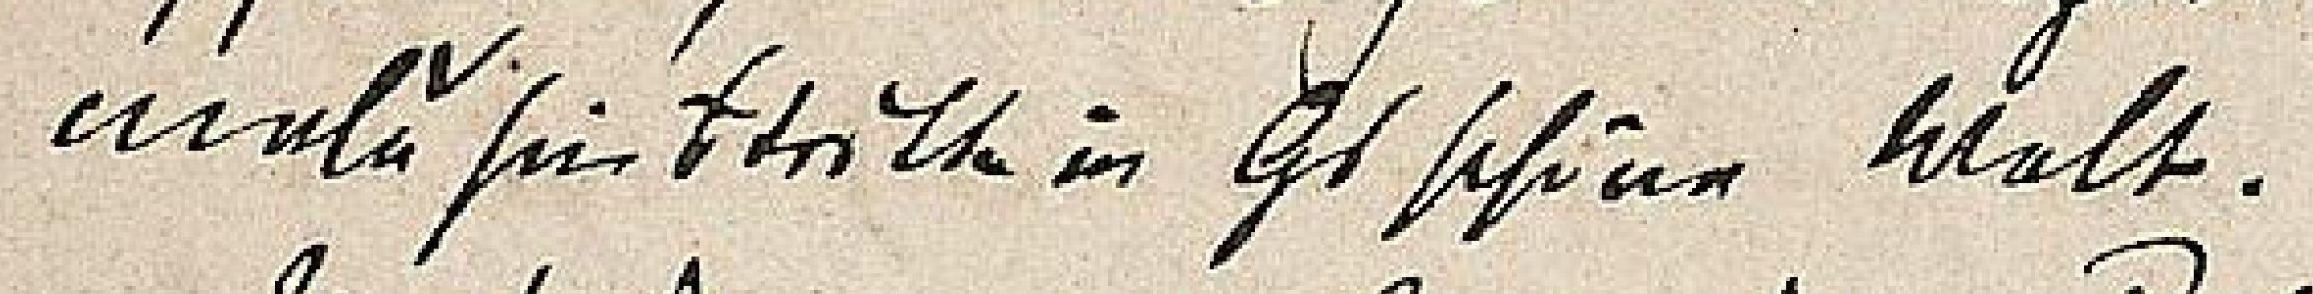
male hinstritt in Gs schöne Welt.
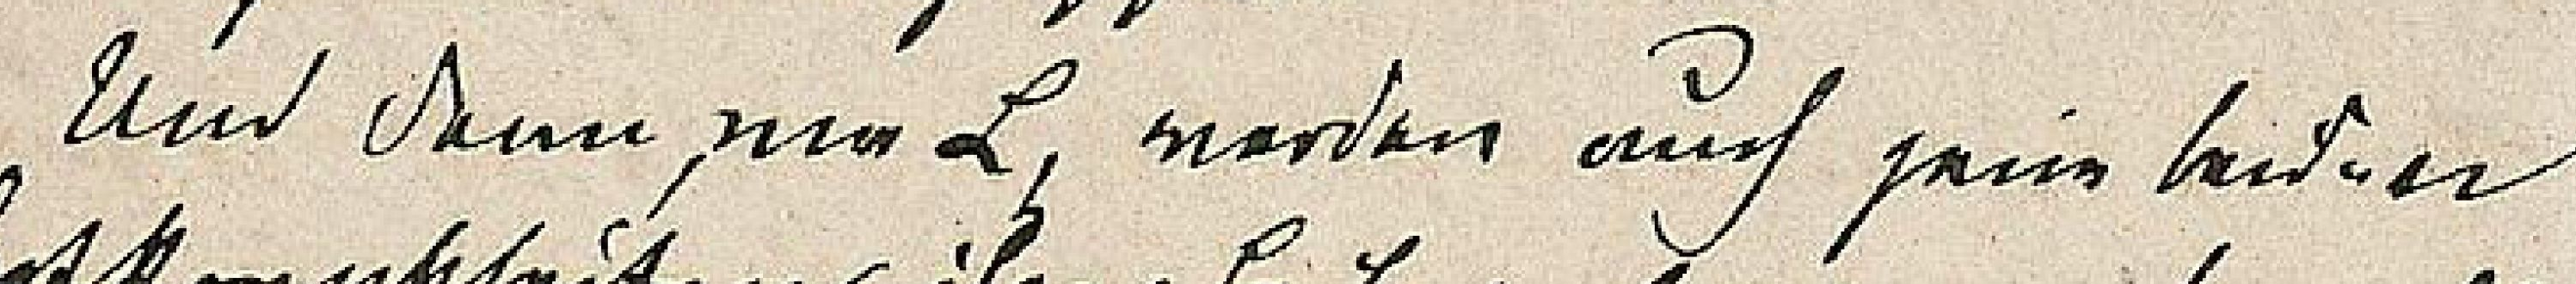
Und dann, m. L. werden auch jene beiden,
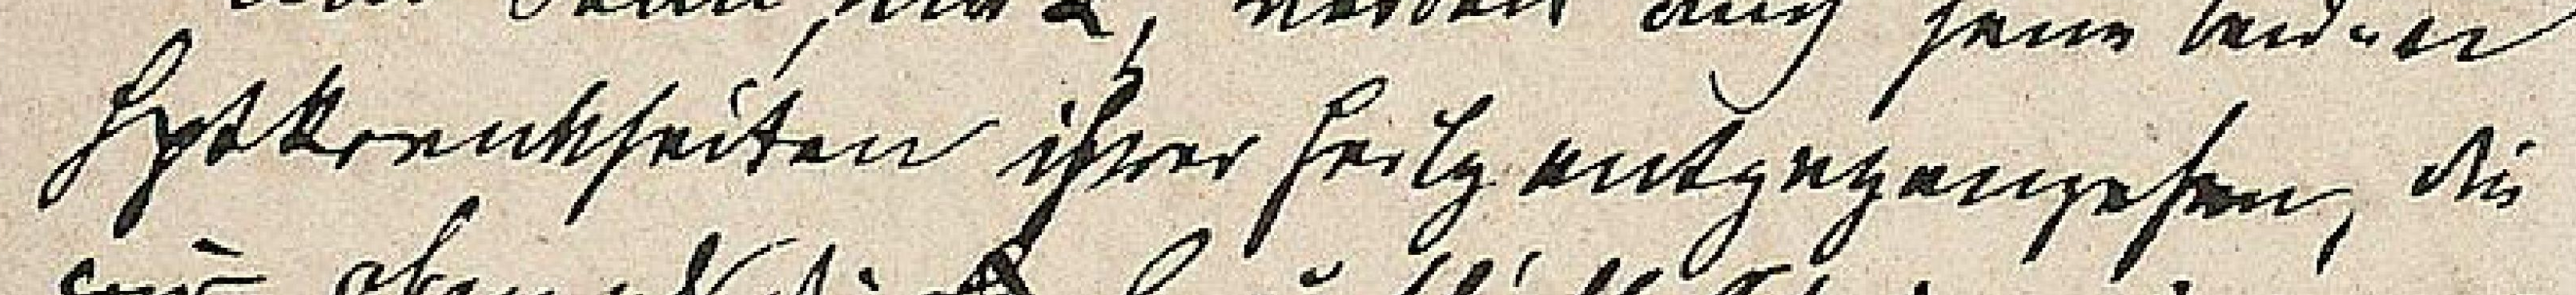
Hptkrankheiten ihrer Heilg entgegengehen, die
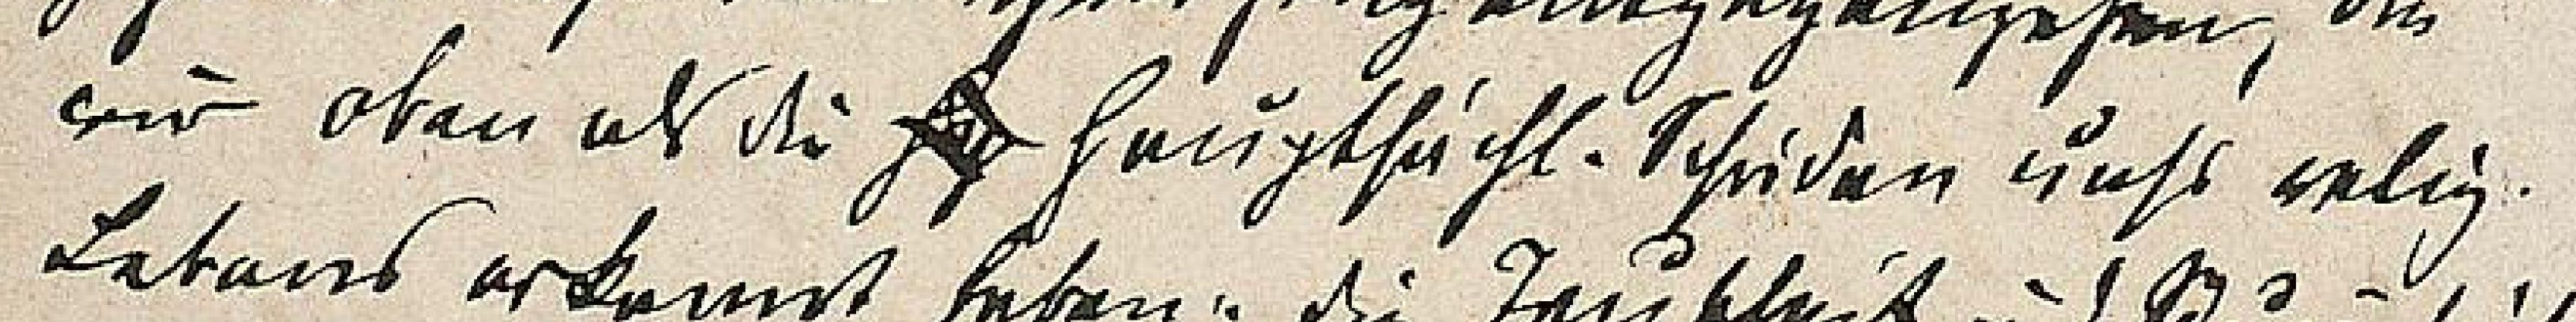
wir eben als die Hp hauptsächl. Schäden unss relig.
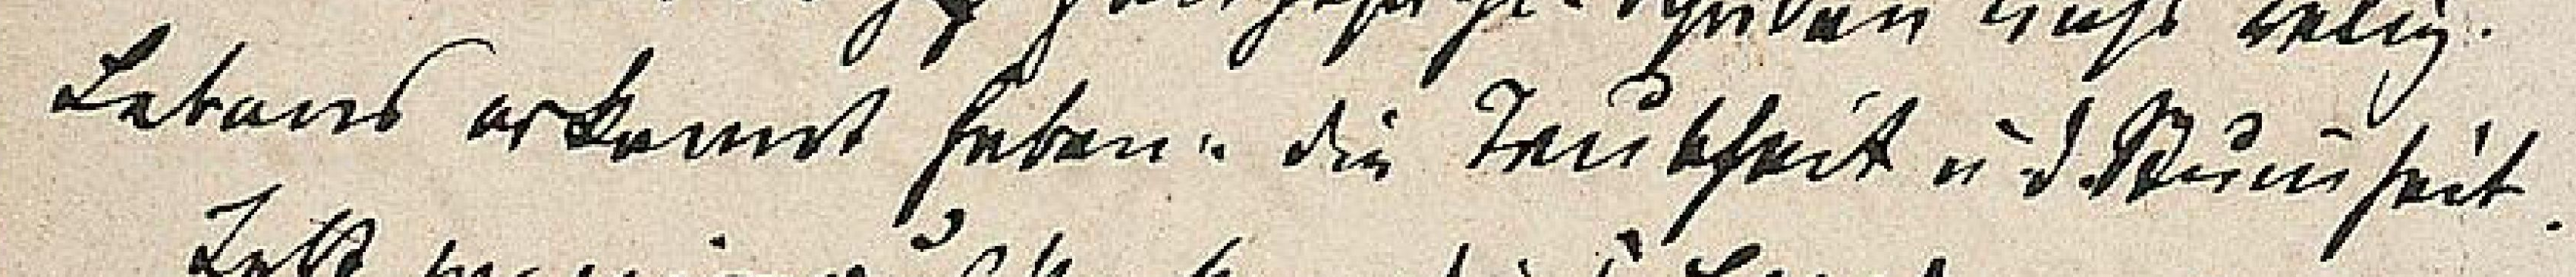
Lebens erkannt haben: die Taubheit u. d. Stumheit
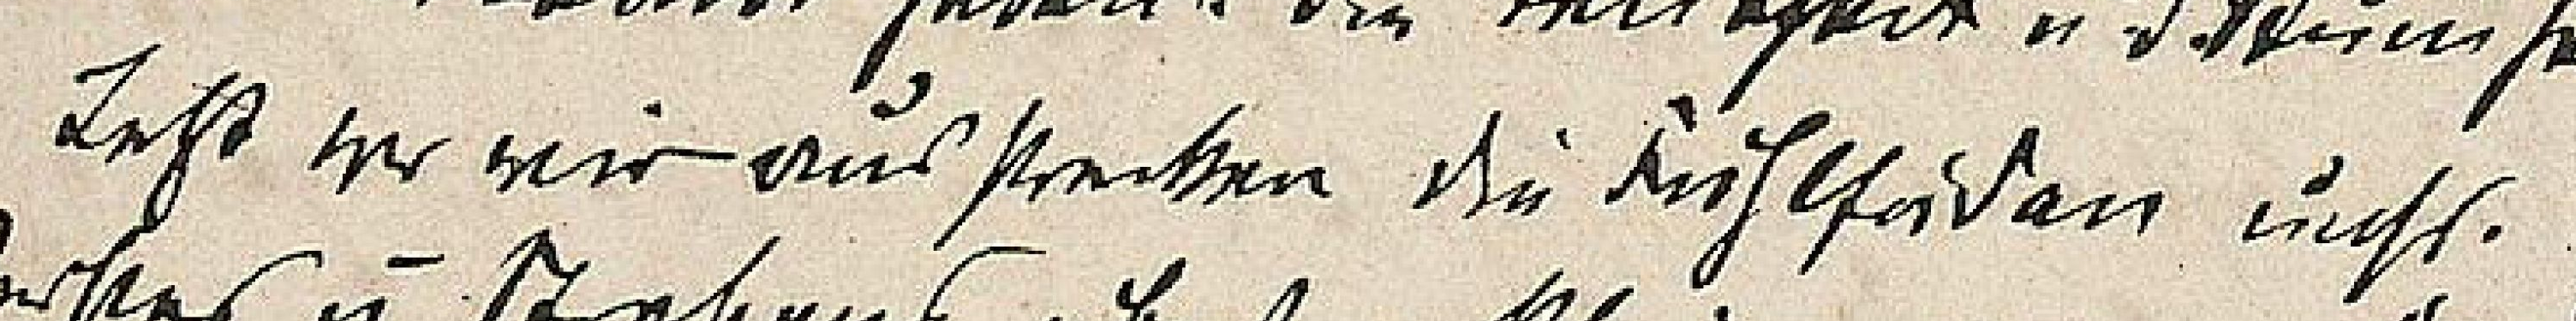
Jetzt wo wir ausstrecken die Fühlfäden unss.
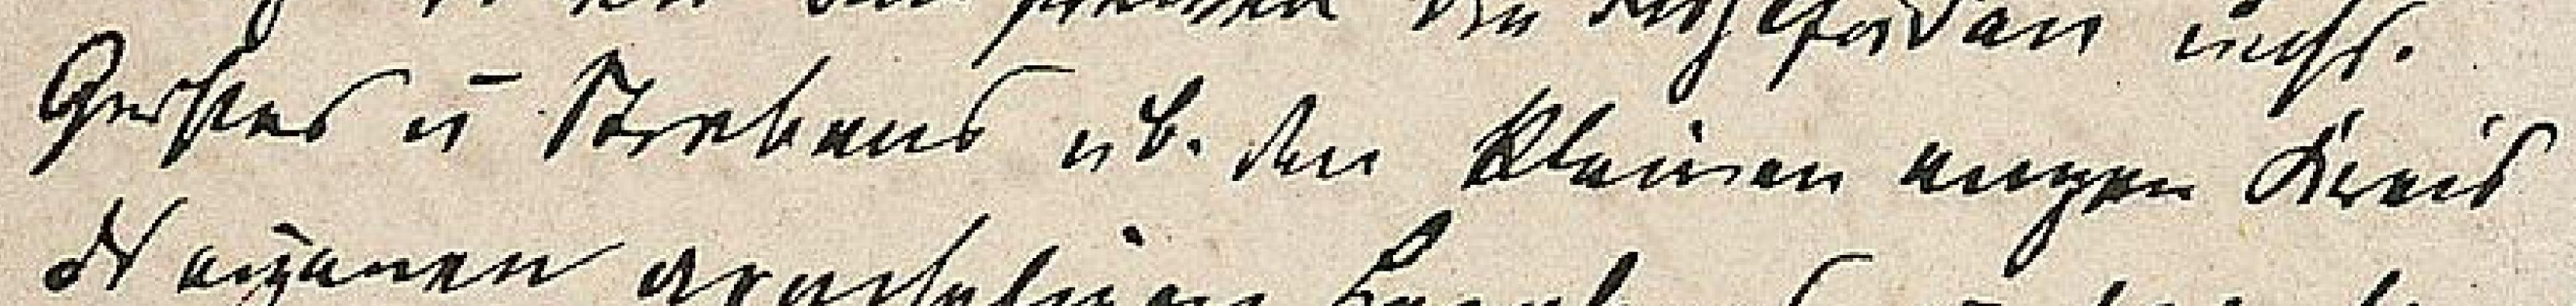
Geiste u Strebens üb. den kleinen engen Kreis
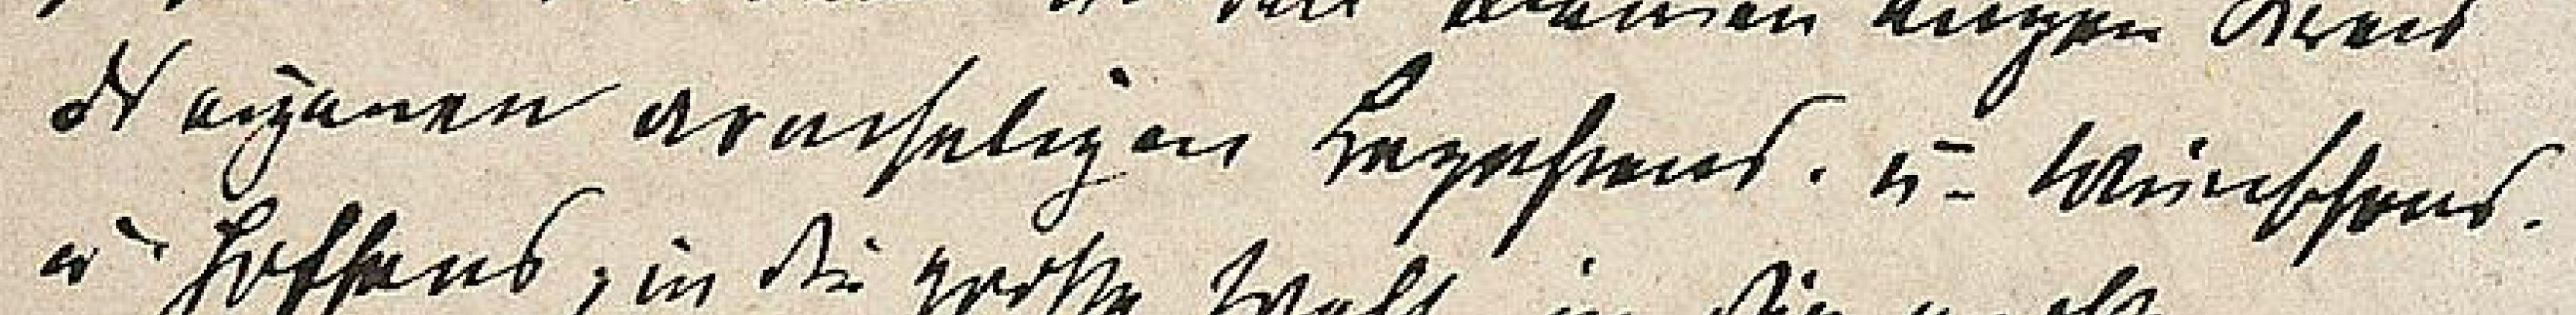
ds eigene armseligen Begehrens u. Wünschens.
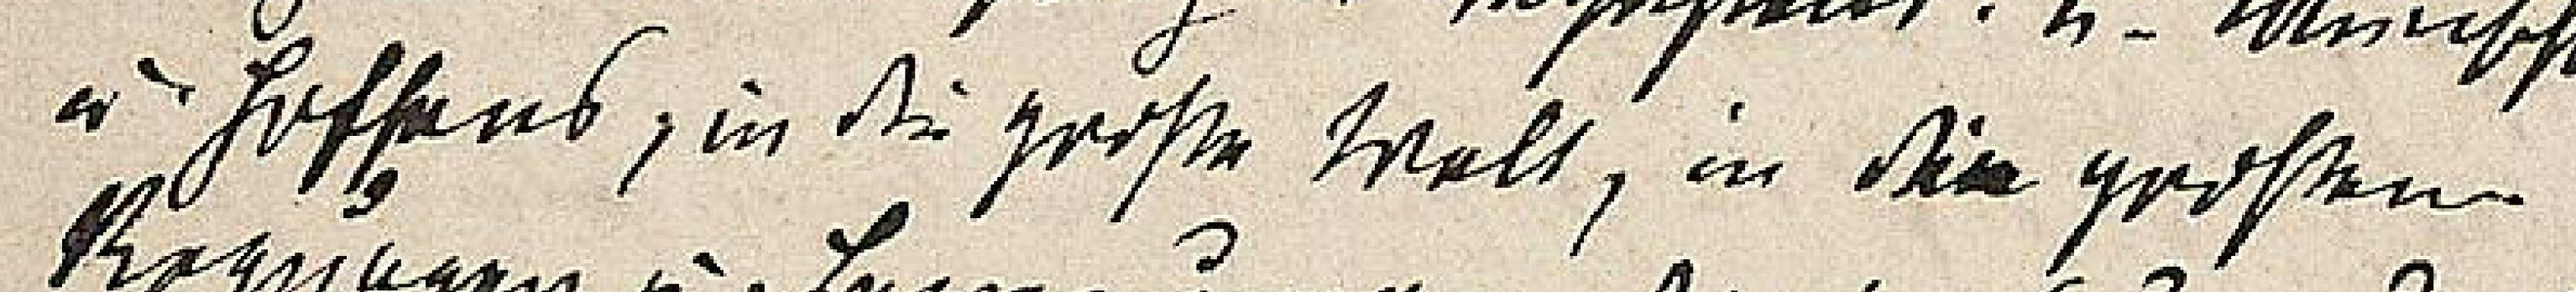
u. Hoffens, in die große Welt, in die großen
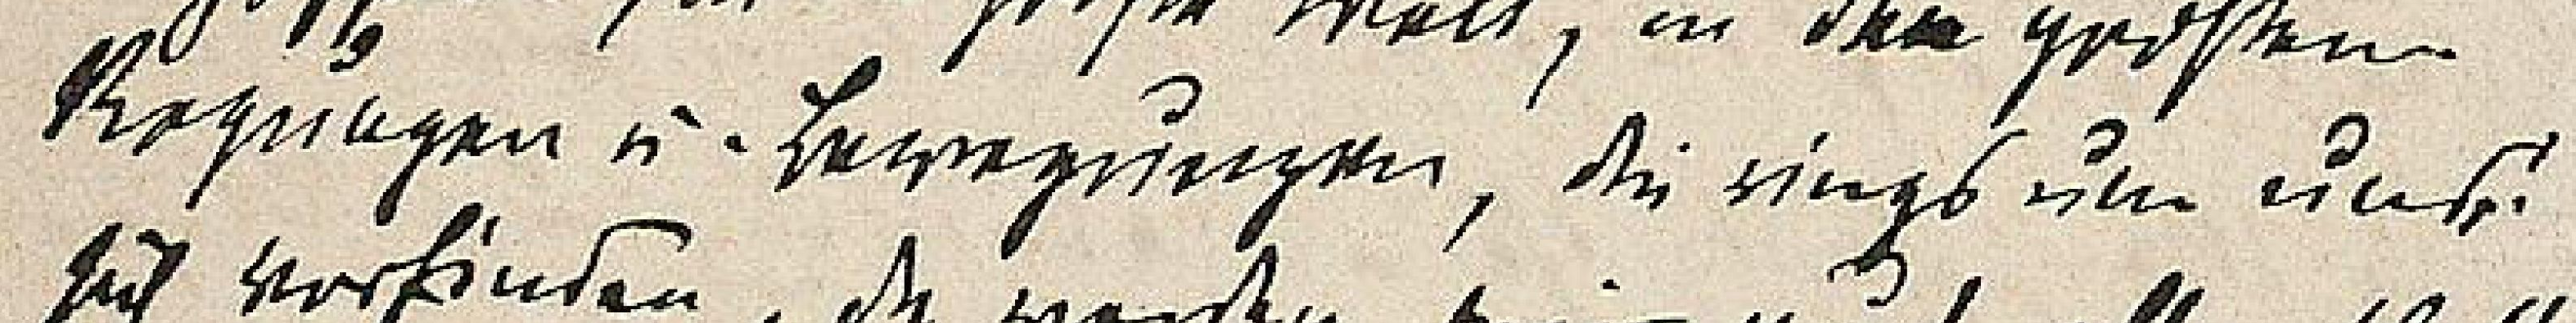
Regungen u. Bewegngen, die rings um uns.!
